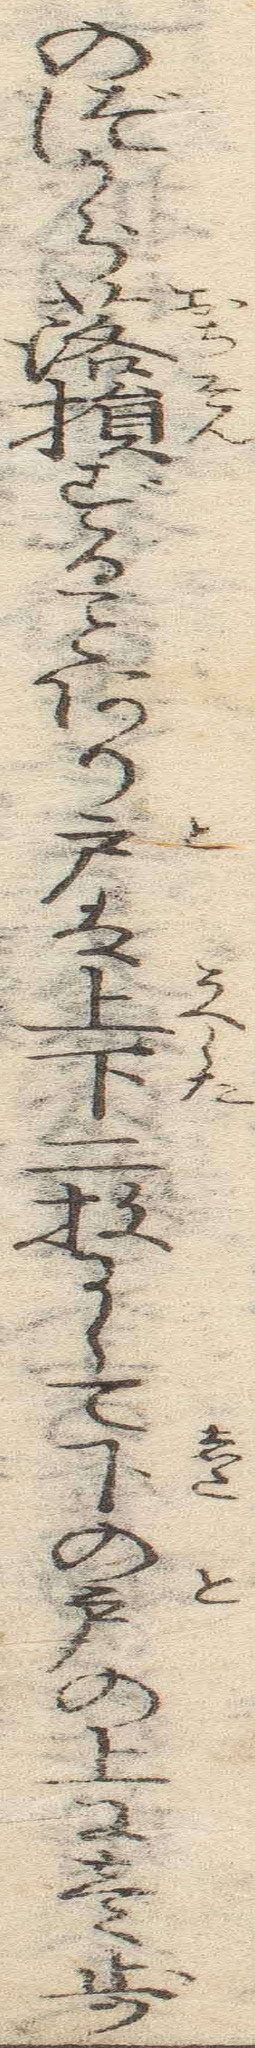のづから落損ずることあり戸は上下二枚にして下の戸の上に壱歩
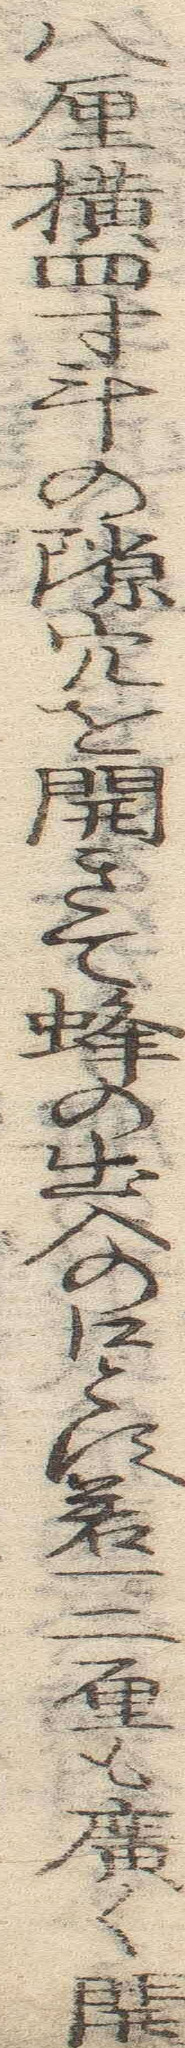八厘横四寸斗の隙穴を開きて蜂の出入の口とす若一二厘も広く開
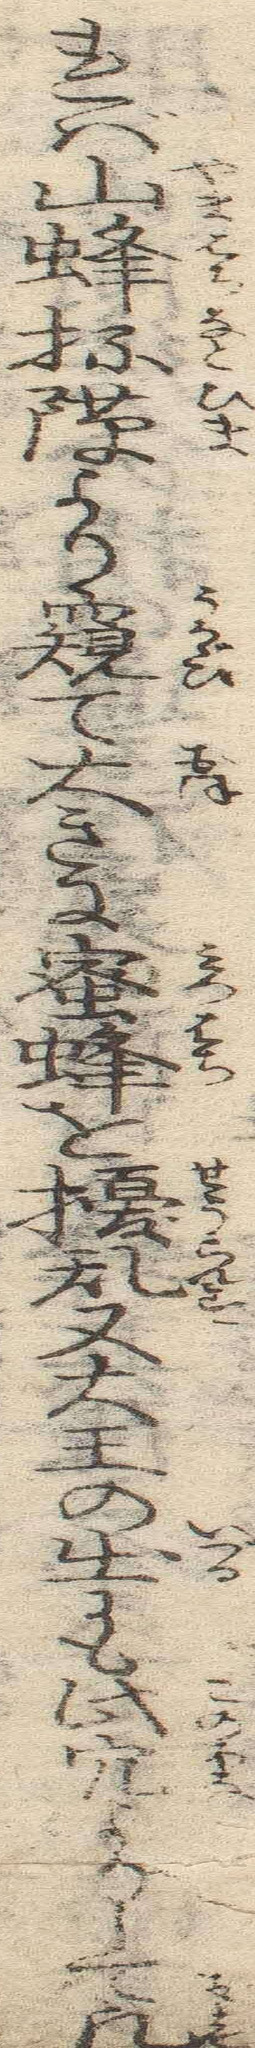れば山蜂抔隙より窺て大きに蜜蜂を擾乱又大王の出にも此穴よりして凡
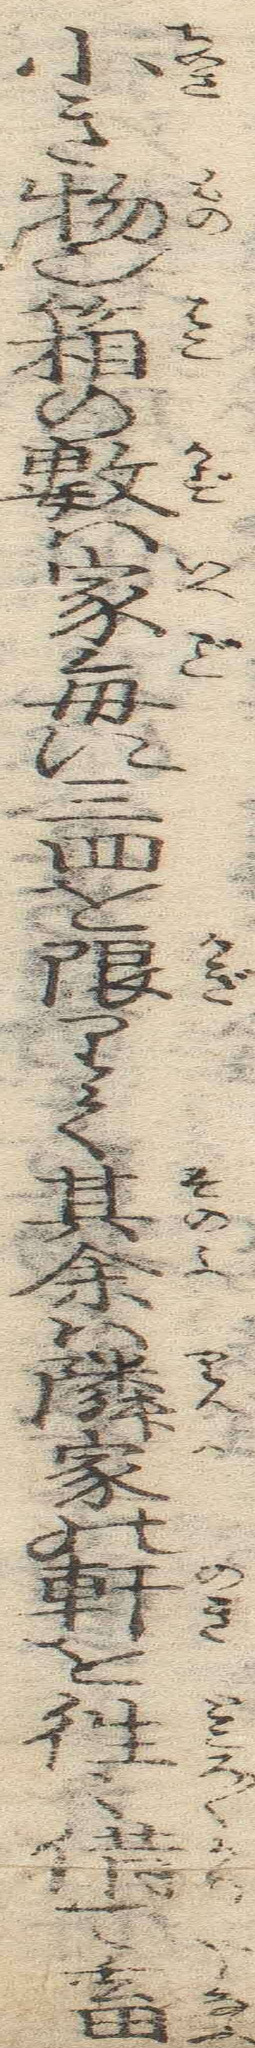小き物也箱の数は家毎に三四を限りて其余は隣家の軒を往々借て畜
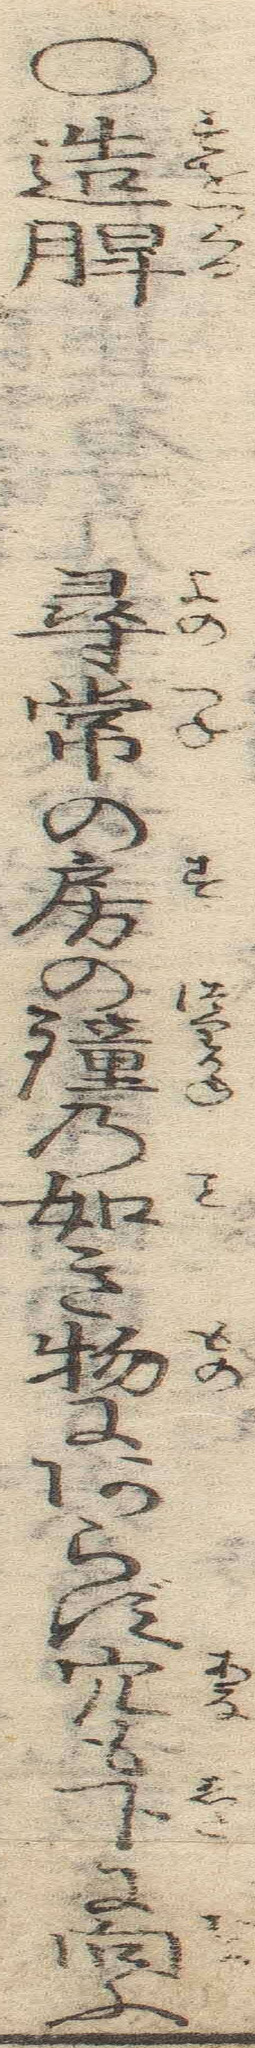○造脾尋常の房の鐘の如き物にあらず穴も下に向ふ
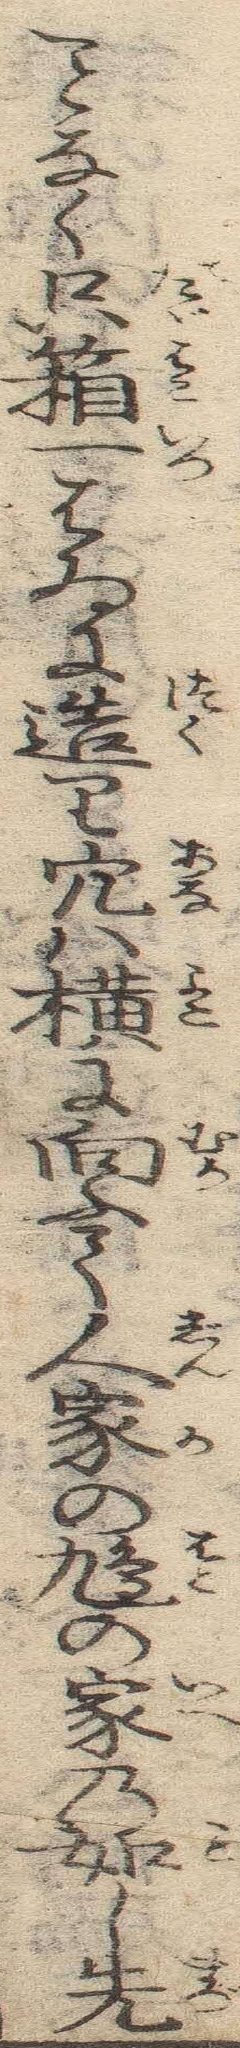ことなく只箱一はゐに造り穴は横に向ふて人家の鳩の家の如し先

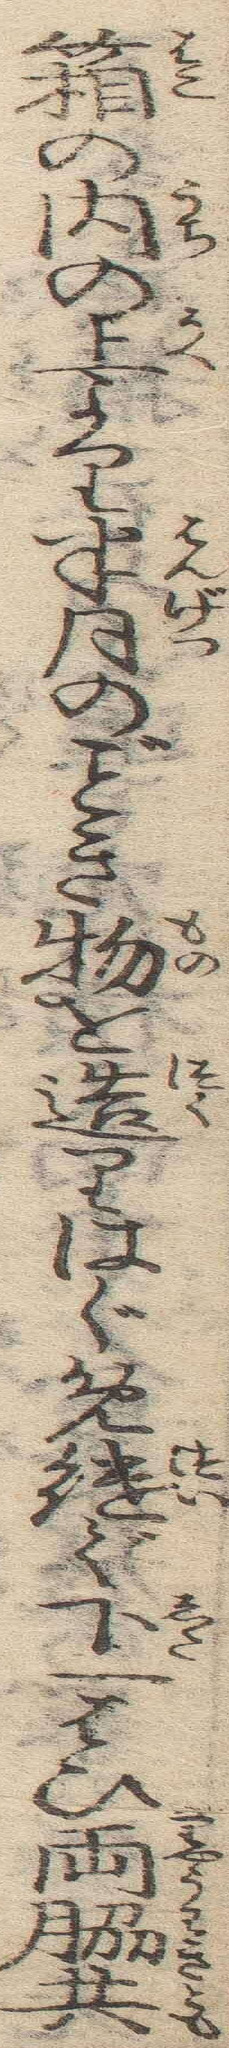箱の内の上より半月のごとき物を造りはじめ継で下一はひ両脇共
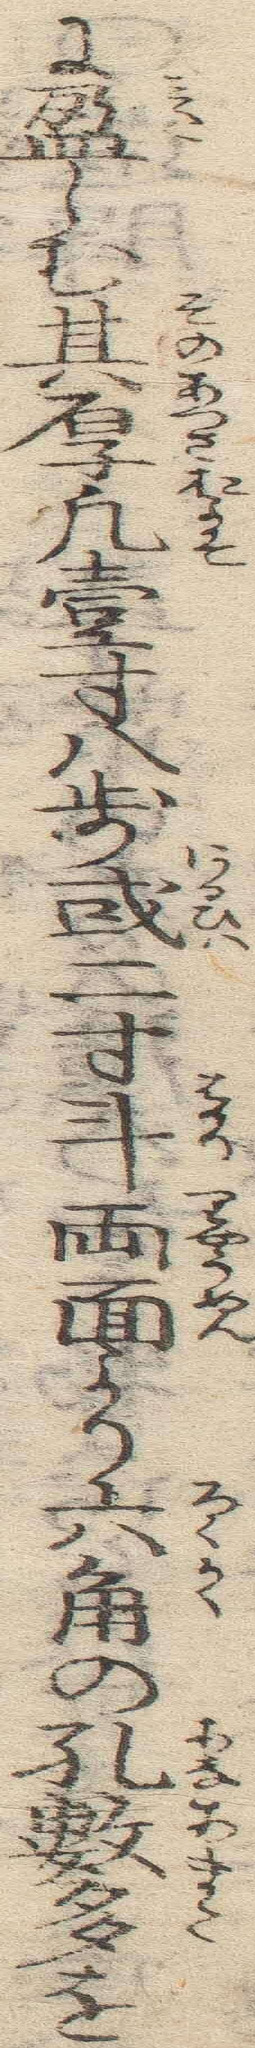に盈しむ其厚凡壱寸八歩或二寸斗両面より六角の孔数多を
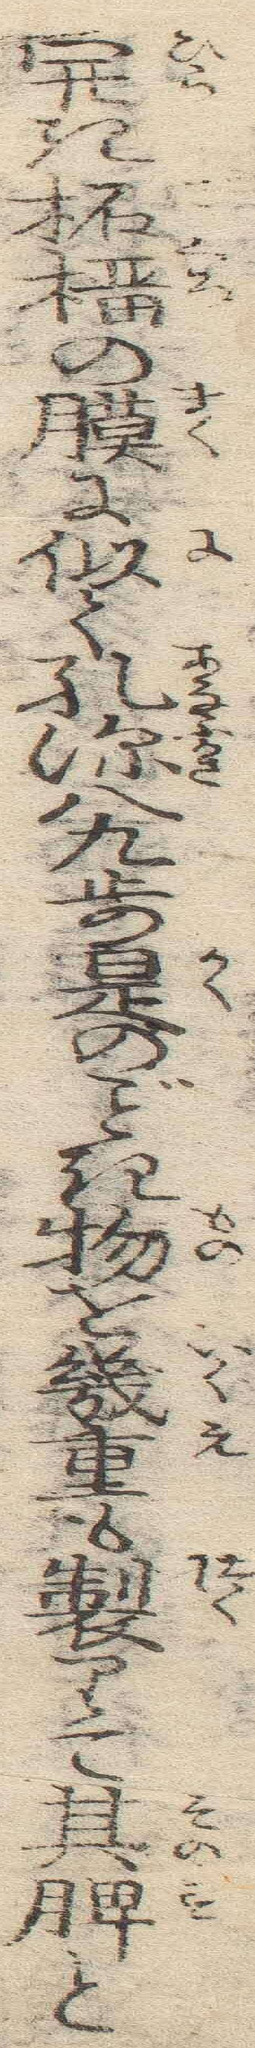開き柘榴の膜に似て孔深八九歩是のごとき物を幾重も製りて其脾と
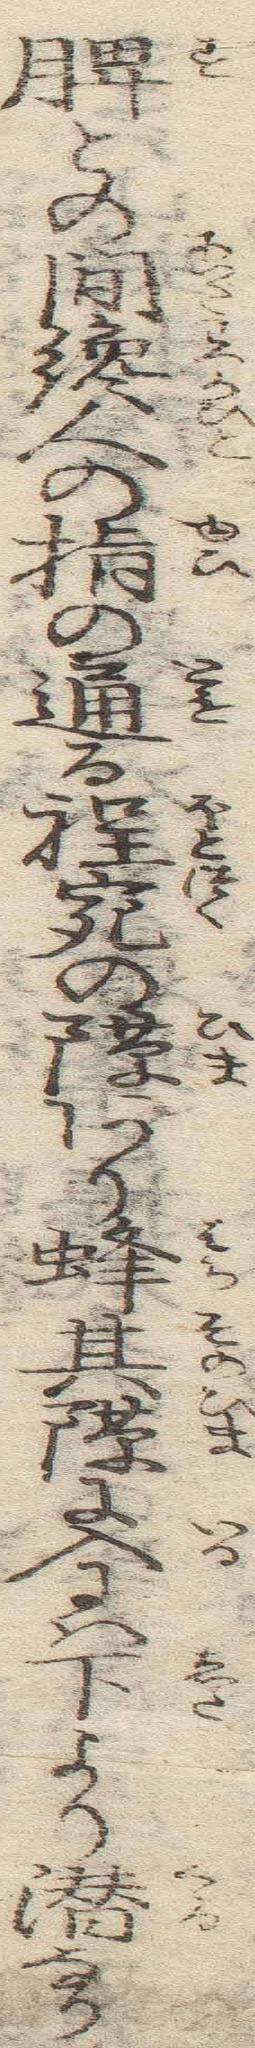脾との間纔人の指の通る程宛の隙あり蜂其隙に入には下より潜なり
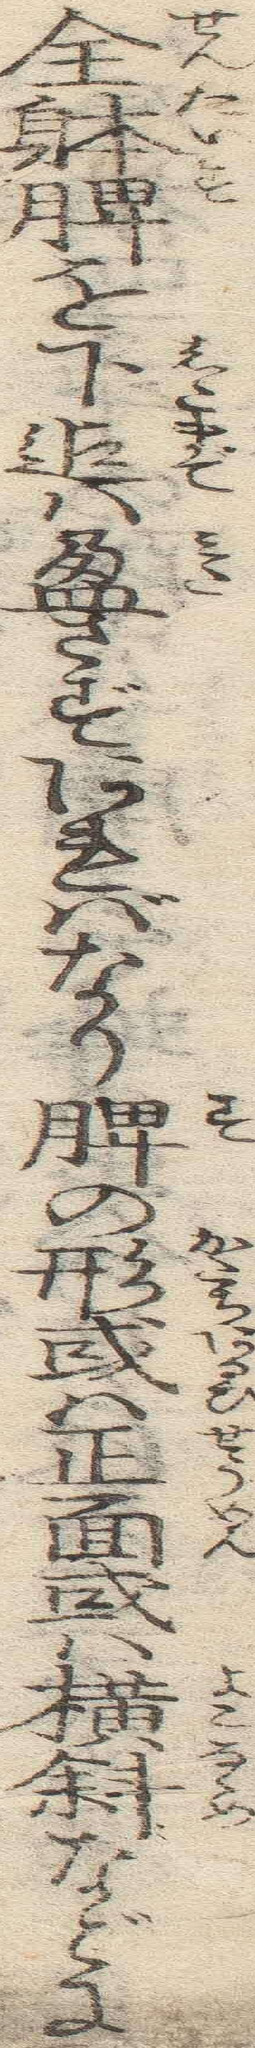全体脾を下迄は盈さずあればなり脾の形或は正面或は横斜などに
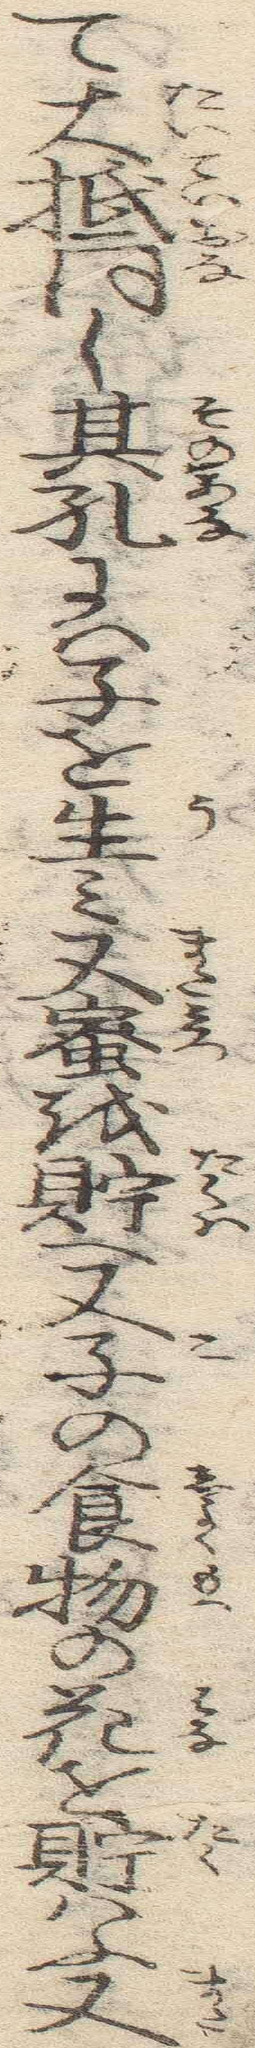て大抵同し其孔には子を生み又蜜を貯へ又子の食物の花を貯はふ又
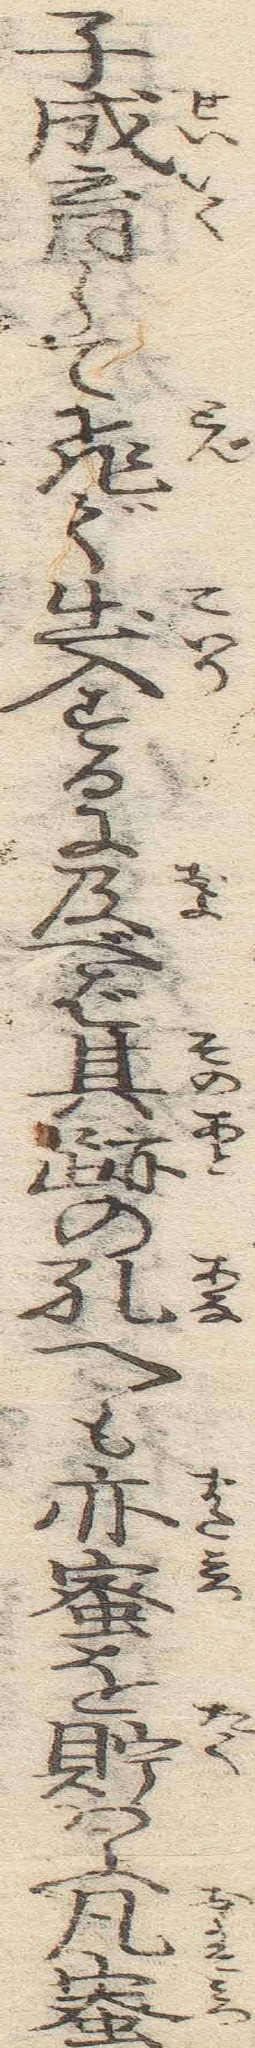子成育して飛で出入するに及べば其跡の孔へも亦蜜を貯はふ凡蜜
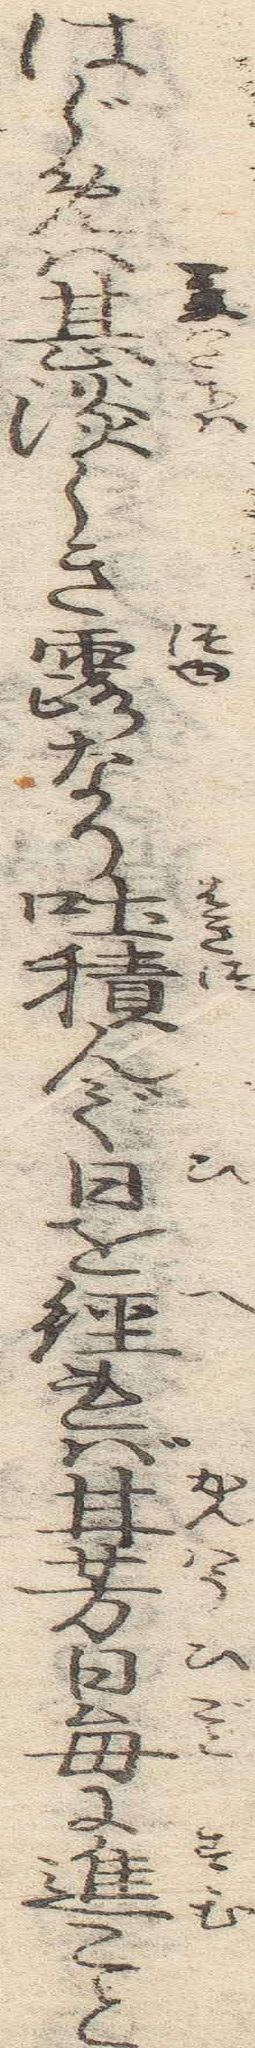はじめは甚淡しき露なり吐積んで日を経れば甘芳日毎に進こと
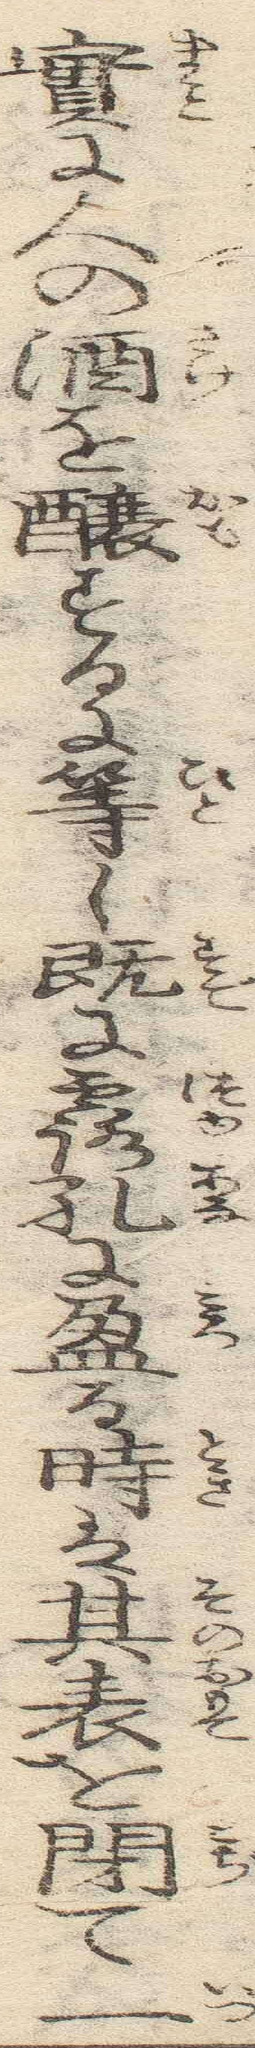実に人の酒を醸するに等し既に露孔に盈る時は其表を閉て一
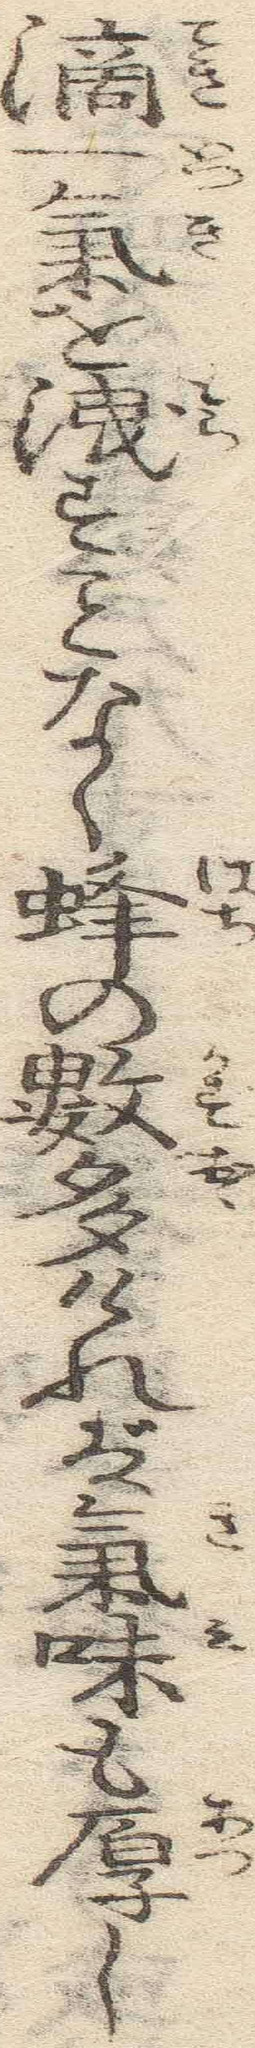滴一気を洩すことなし蜂の数多ければ気味も厚し
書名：日本山海名産図会
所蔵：東京学芸大学附属図書館 国文学研究資料館
